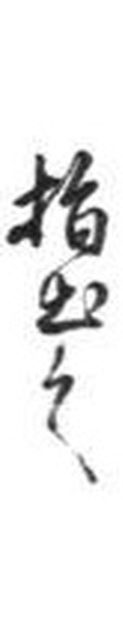指出之
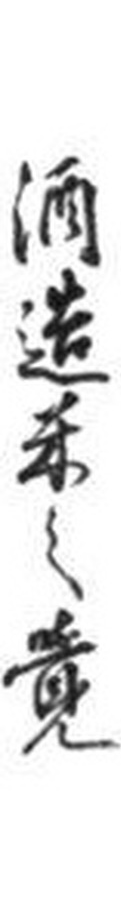酒造米之覚
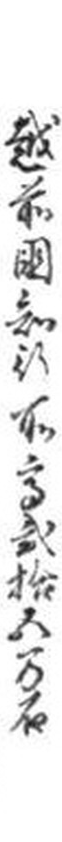越前国知行所高弐拾五万石
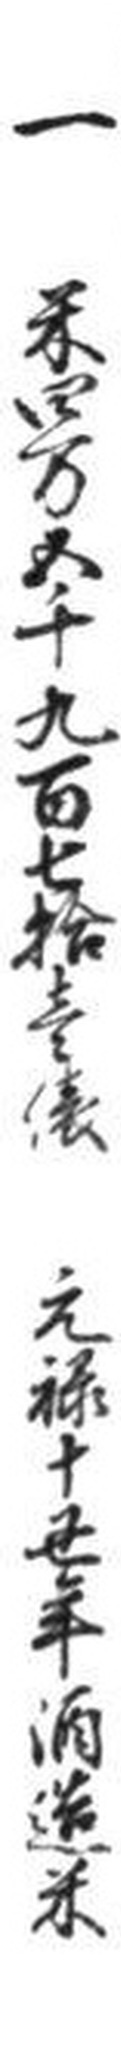一米四万五千九百七拾壱俵元禄十丑年酒造米
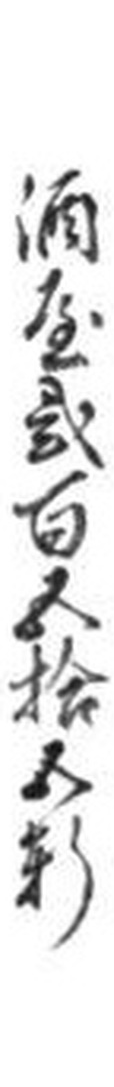酒屋弐百五拾五軒
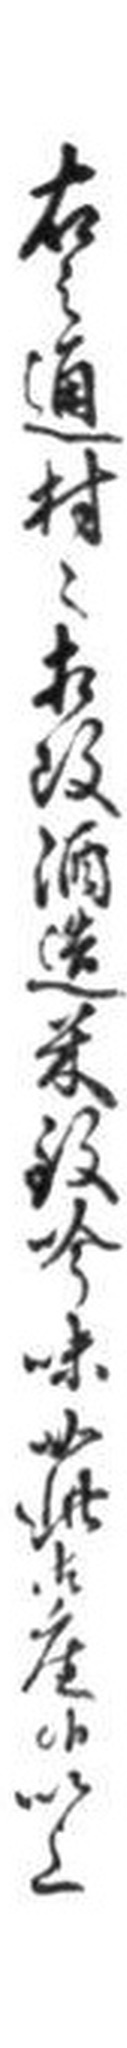右之通村々相改酒造米致吟味如此御座候以上
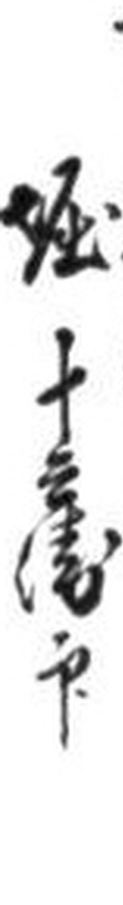堀十兵衛印
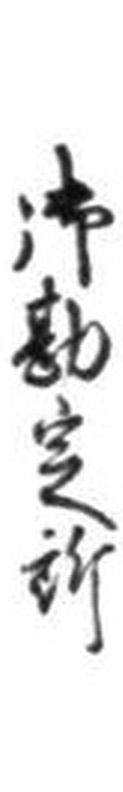御勘定所
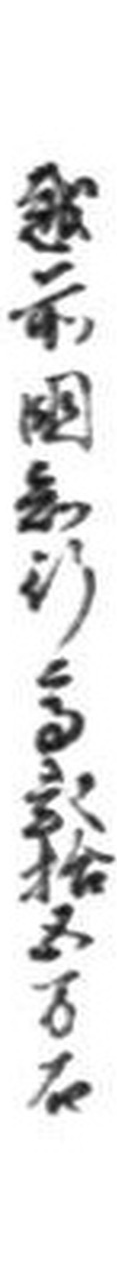越前国知行所高弐拾五万石
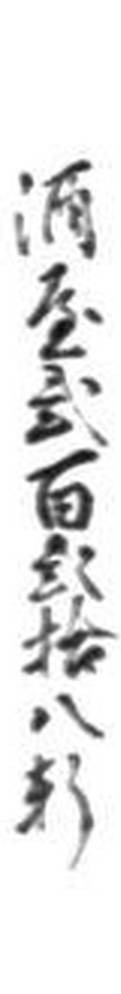酒屋弐百弐拾八軒
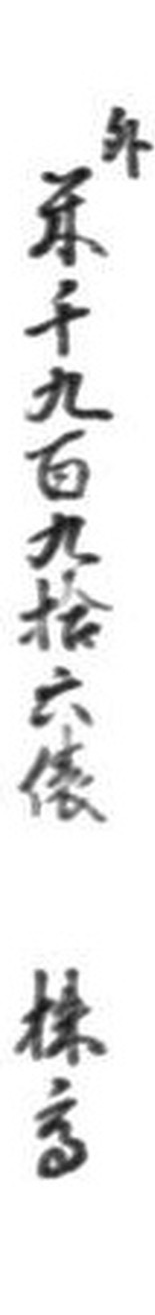外米千九百九拾六俵株高
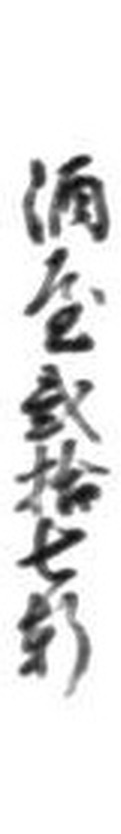酒屋弐拾七軒
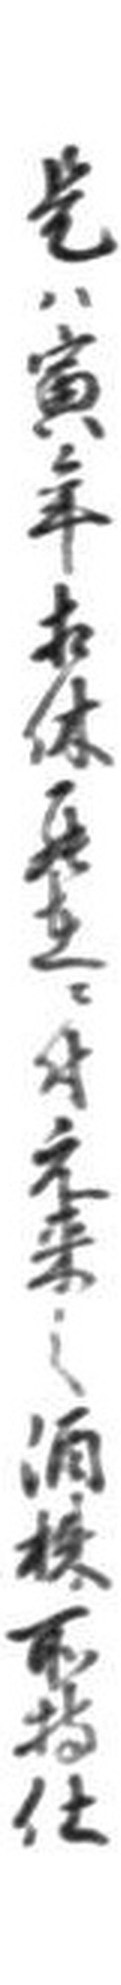是ハ寅年相休罷在ニ付元来之酒株所持仕
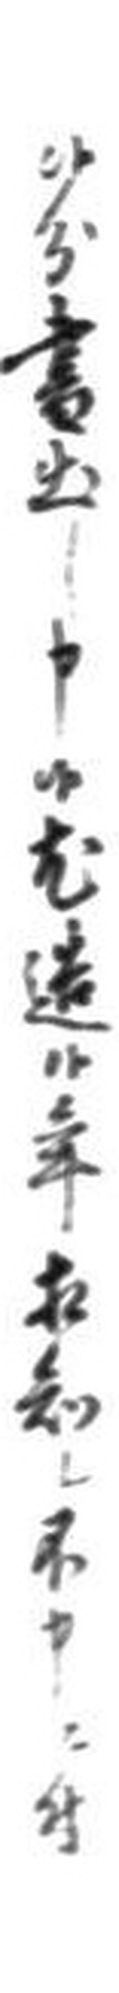候分書出し申候尤造候年相知レ不申ニ付
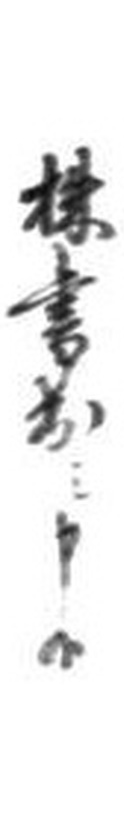株書出シ申候
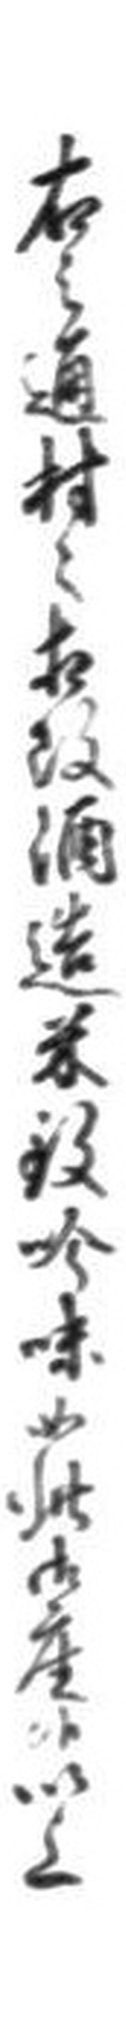右之通村々相改酒造米致吟味如此御座候以上
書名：家譜 二十二 吉品公 従元禄十五年到同十六年
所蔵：福井県文書館 Fukui Prefectural Archives
